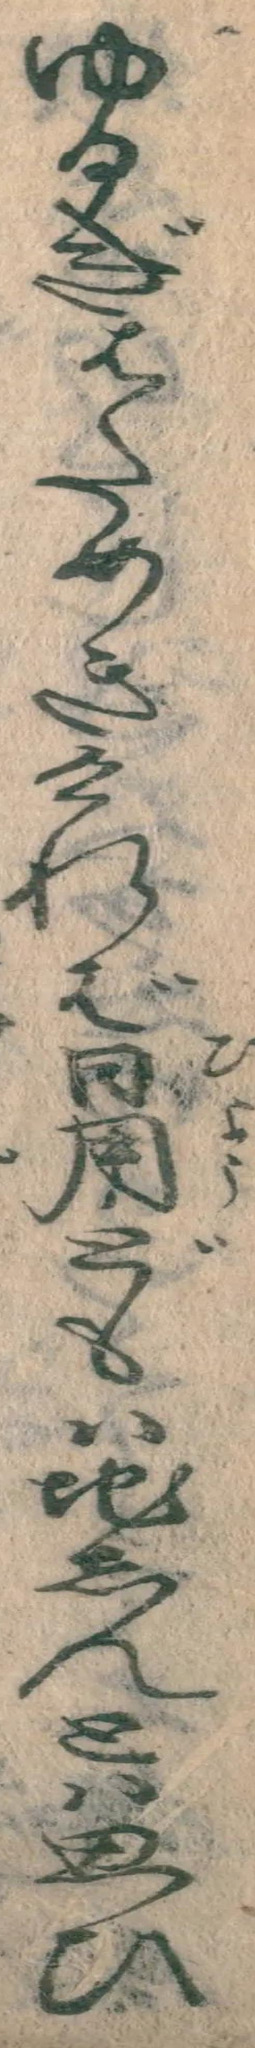ゆるぎはためきければ日用どもは地しんとは思ひ
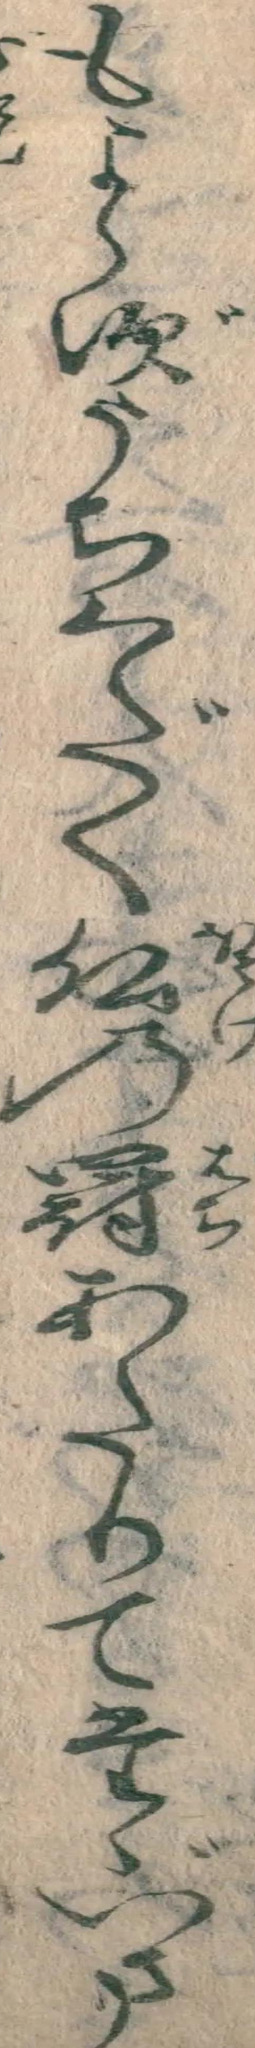もよらずうちくだく仏の罰あたりてたゞいま
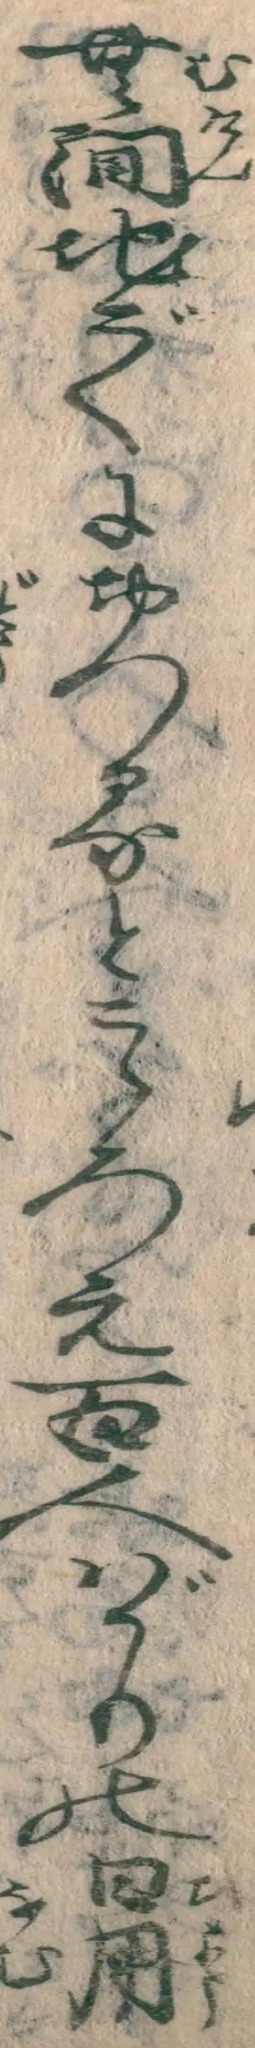無間地ごくにおつるとこゝろえ百人ばかりの日用
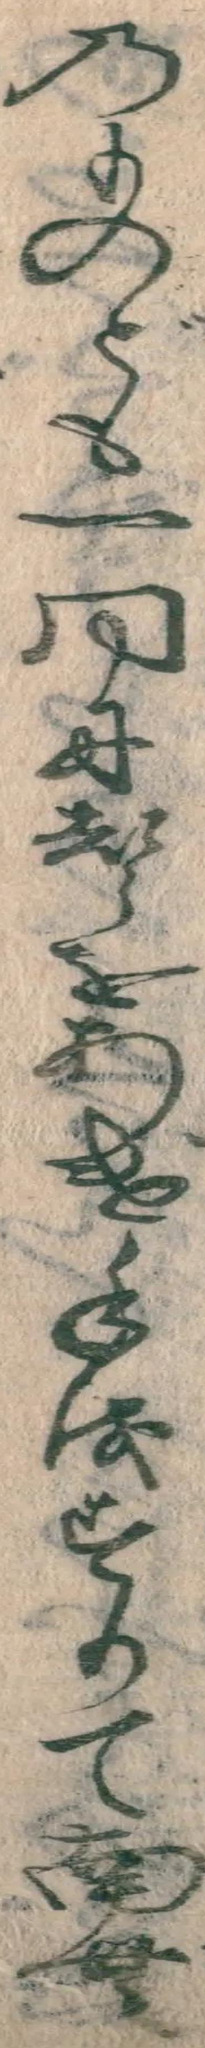のものども一同に聲をあげ手をすりて南無
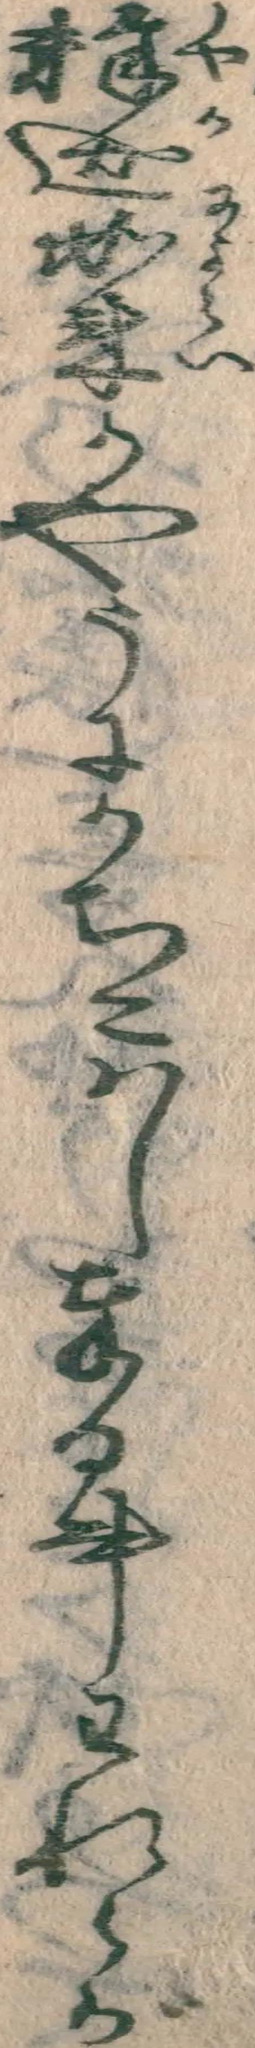釋迦如来かやうにうちこはし奉る事われらが
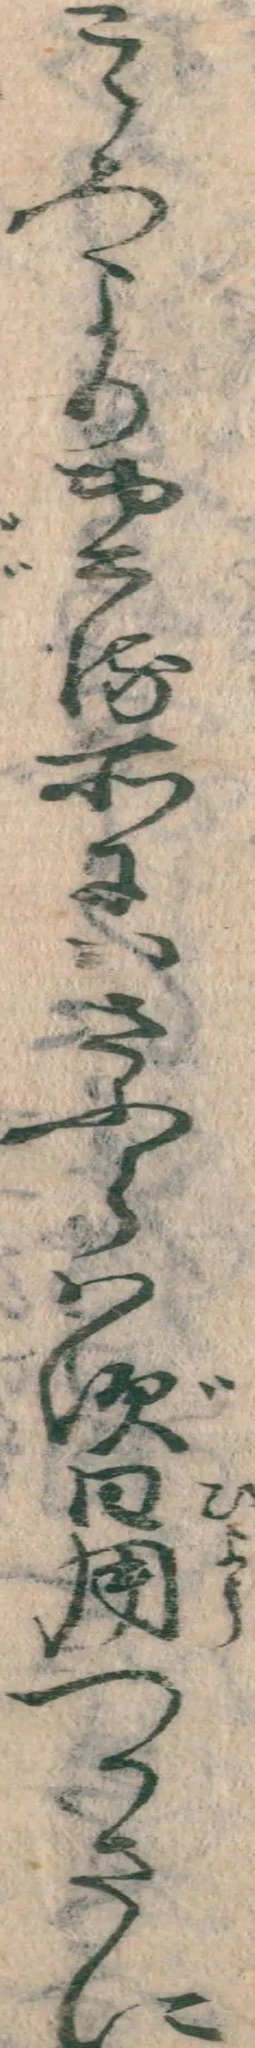こころよりおこる所にはさふらはず日用つかさに
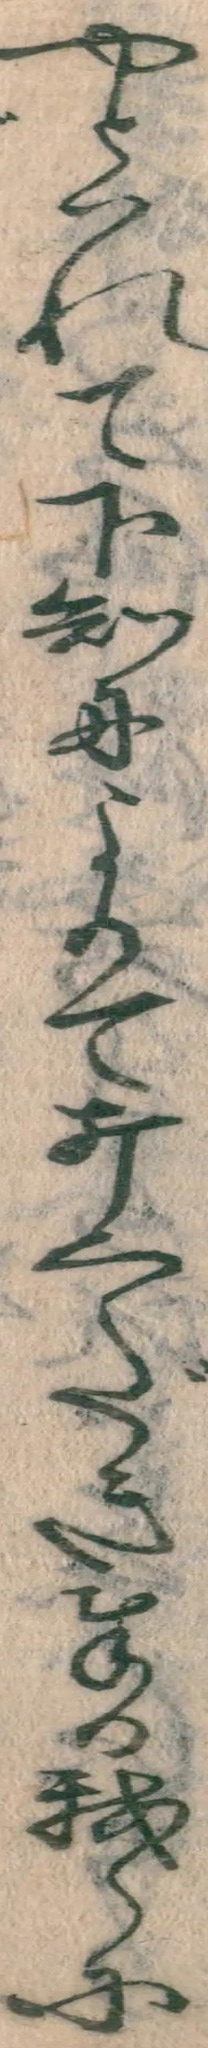やとはれて下知によりて打くだき奉る我らに
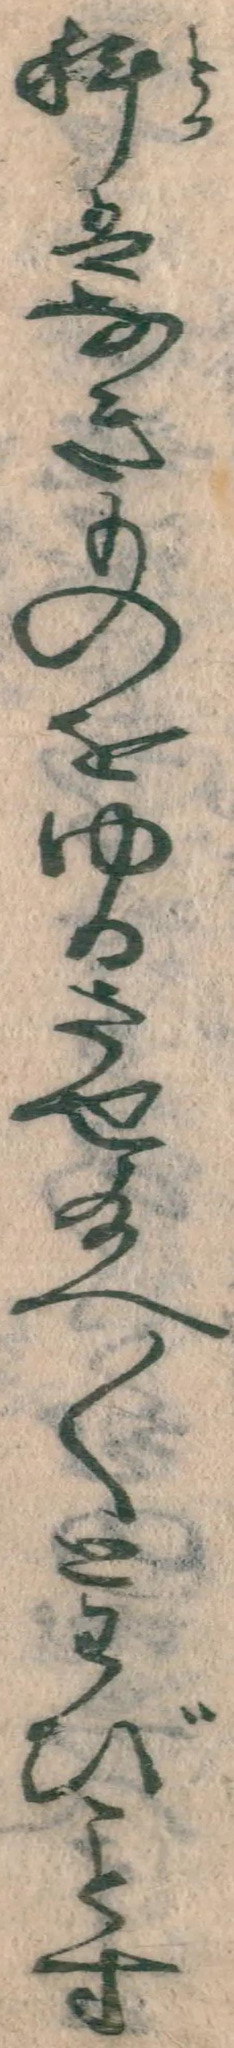科はなきものをゆるさせ給へ〳〵とわびことす
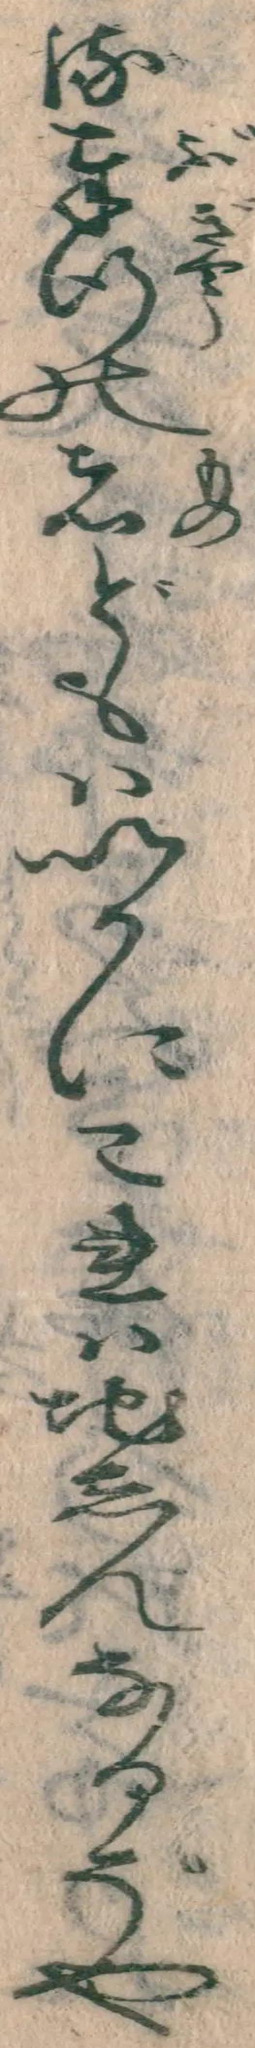る奉行の者どもはいかにこれは地しんなるぞや
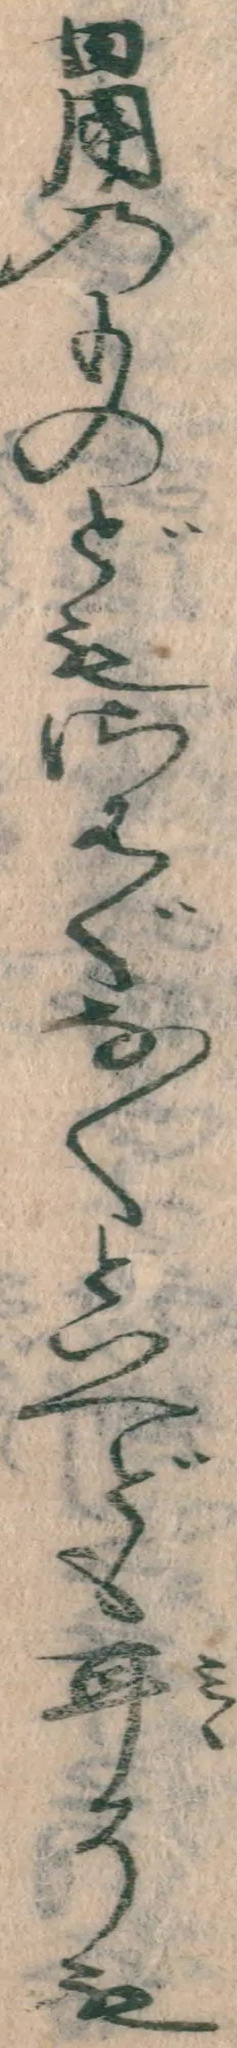日用のものどもさはぐな〳〵といへども耳にも
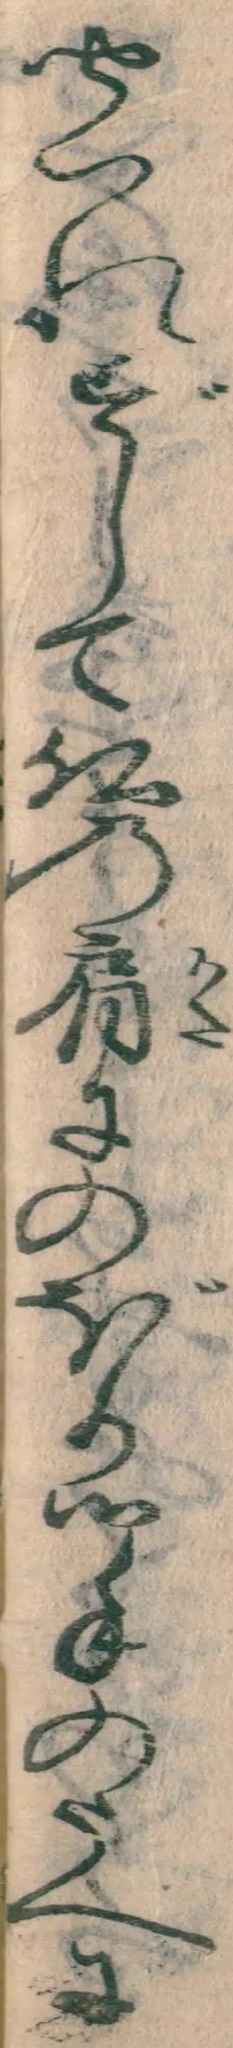聞きいれずして仏の肩にのぼり御手のうへに
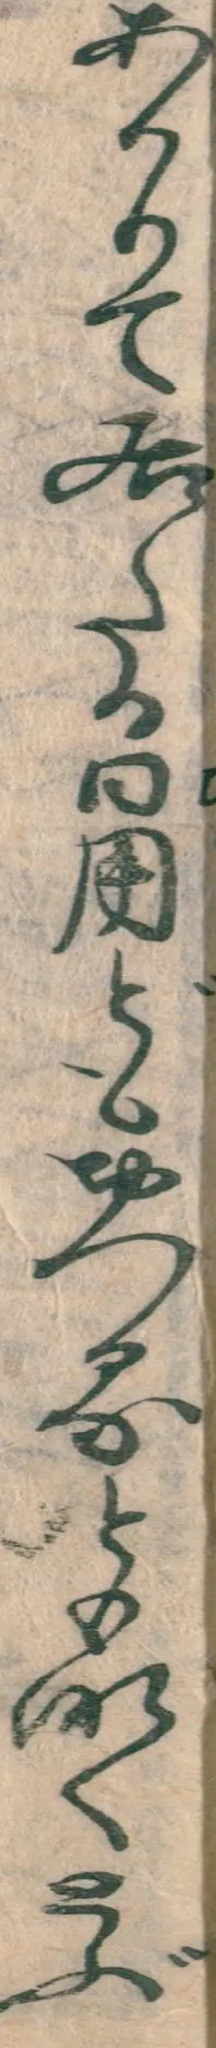あかりて居たる日用どもおつるともなくとぶ
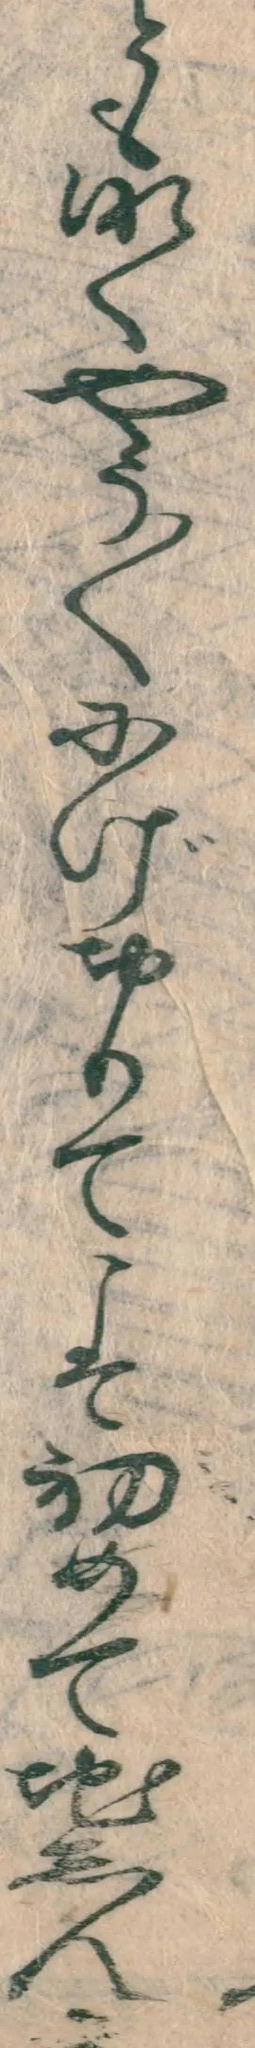ともなくやう〳〵にげおりてこそ初めて地しん
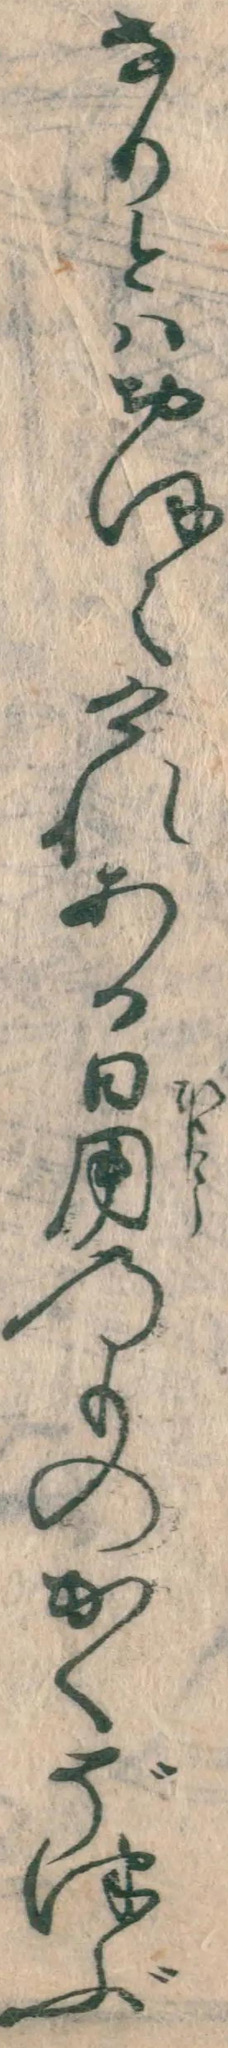なりとはおほえけれある日用のものかくぞつぶ
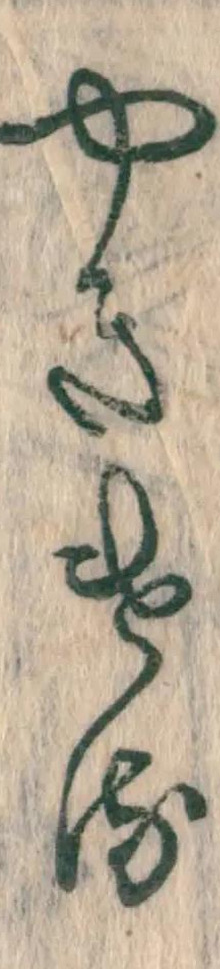やきける
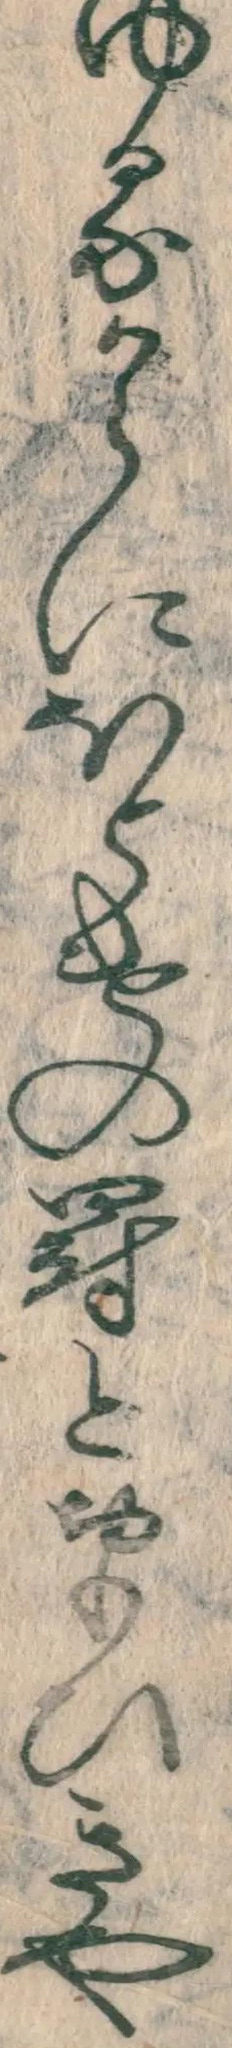ゆるからにほとけの罰とおもひきや
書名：艱難目異志. 上,下
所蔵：国立国会図書館 National Diet Library, JAPAN
